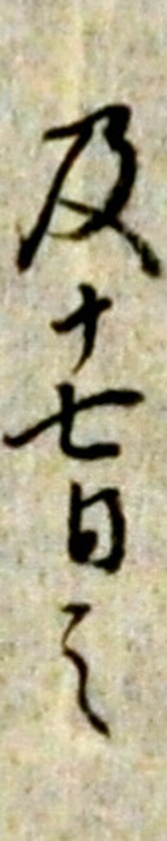及十七日之
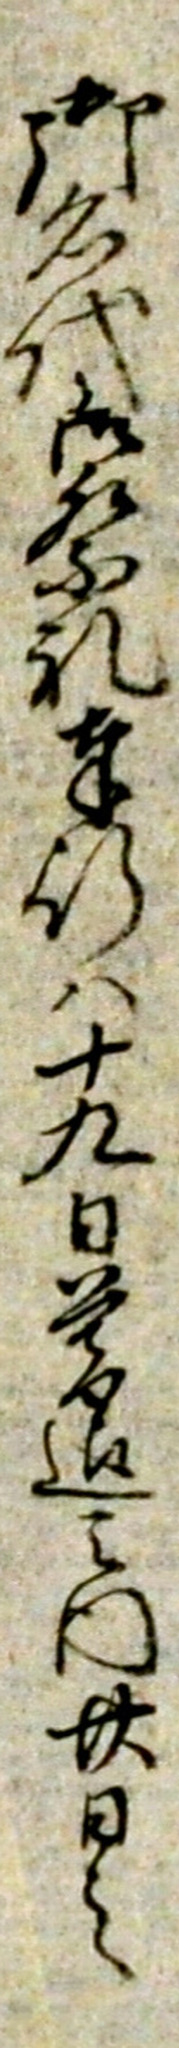御名代御祭礼奉行ㇵ十九日當迄之内廿日之
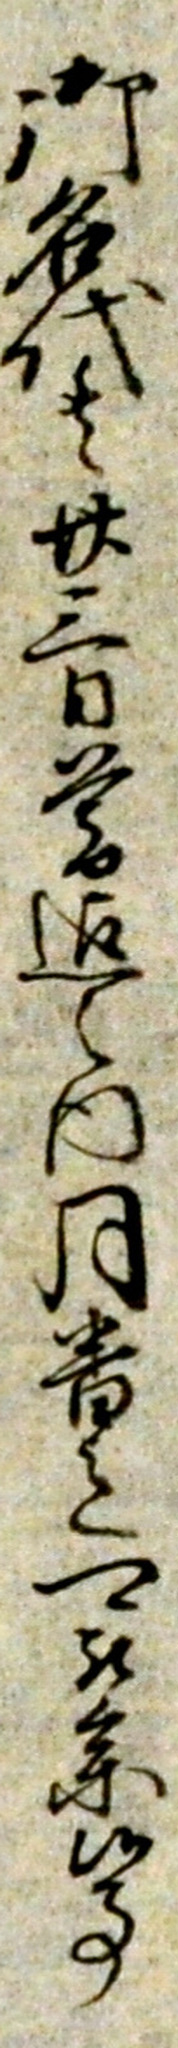御名代者廿三日當迄之内月番迄可被参候事
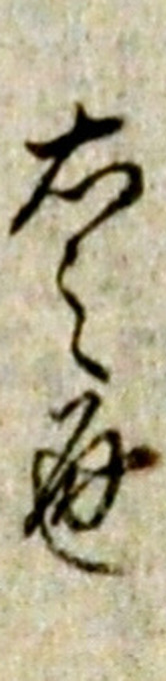右之通
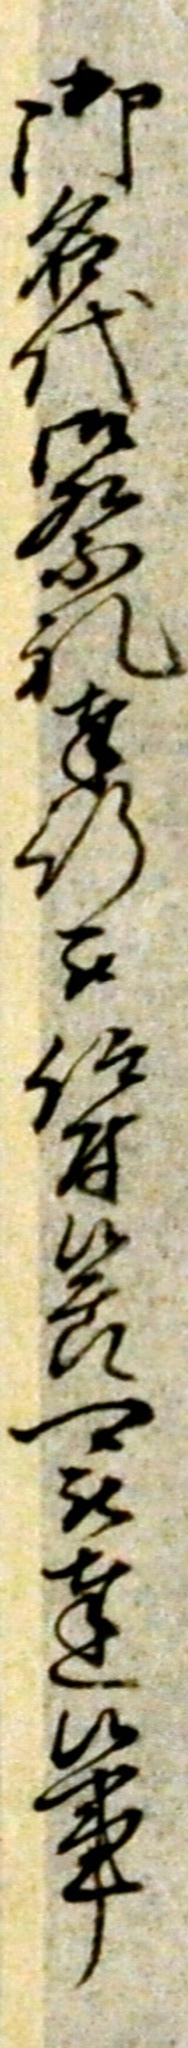御名代御祭礼奉行被仰付候節可被達候事
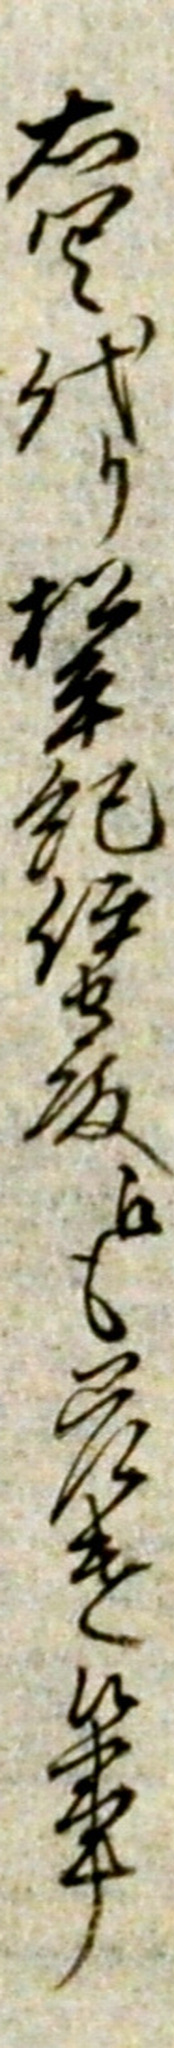右写代り松平紀伊守殿江も差遣候
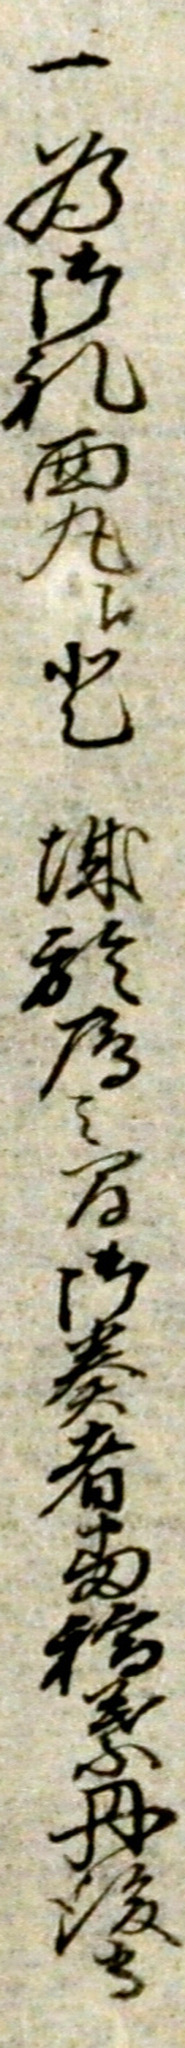一為御礼西丸江登城於雁之御奏者番鴉葉丹波守
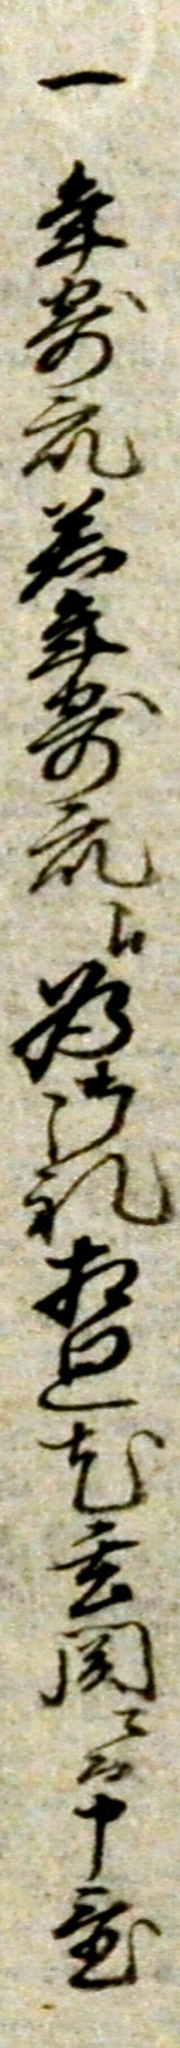一年寄衆若年寄衆江為御礼相廻尤玄関二而申置
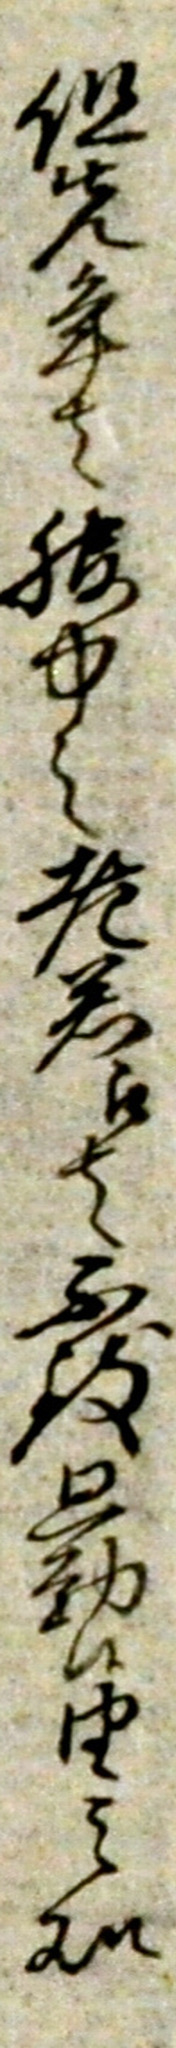但先年者腹中之老若江者不致廻勤候由之処
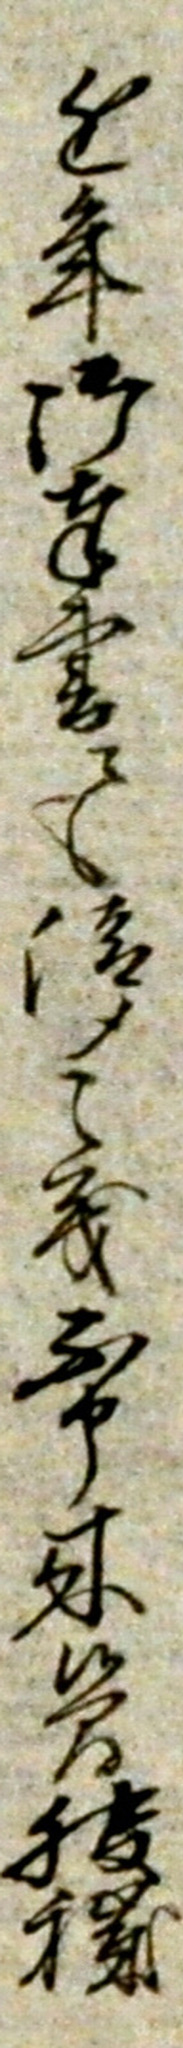近年御奉書ニも清メ之義不申来候間腹穢参着

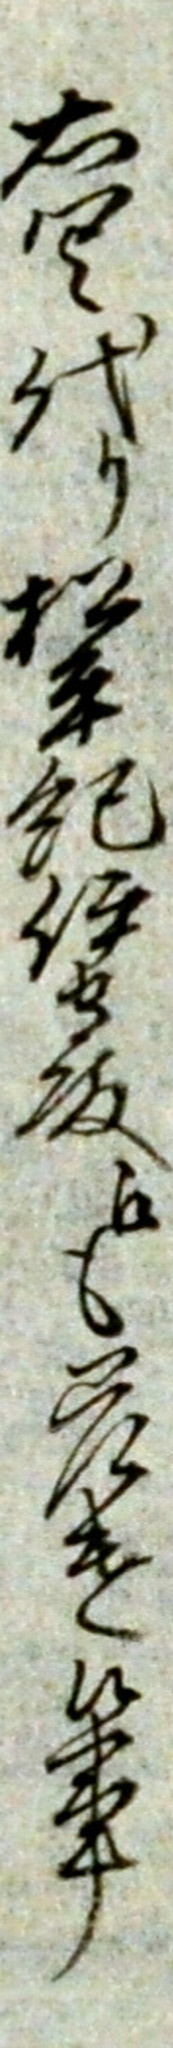右写代り松平紀伊守殿江も差遣候事
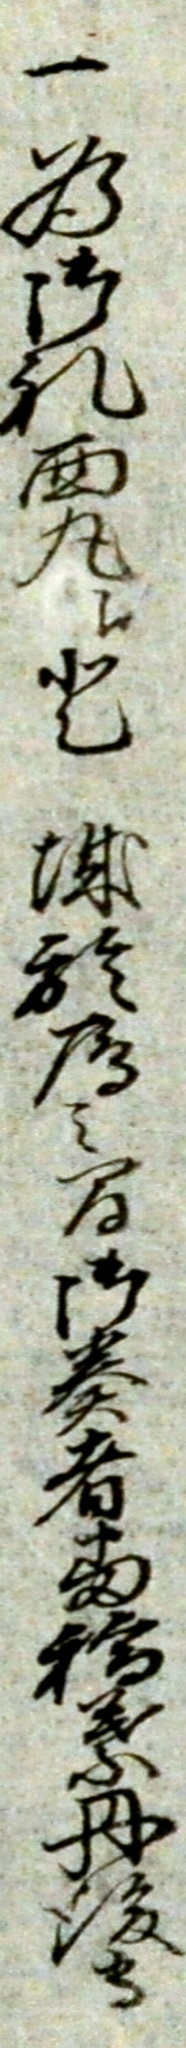一為御礼西丸江登城於雁之間御奏者番鴉葉丹後守
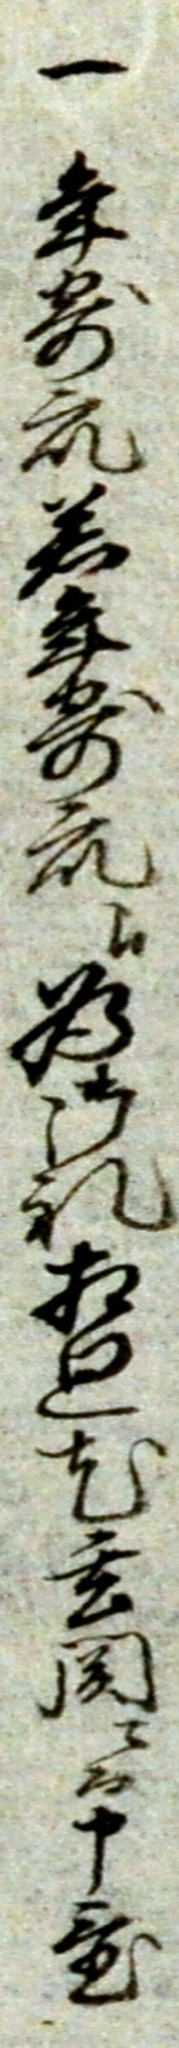一年寄衆若年寄衆江為御礼相廻尤玄関二而申置
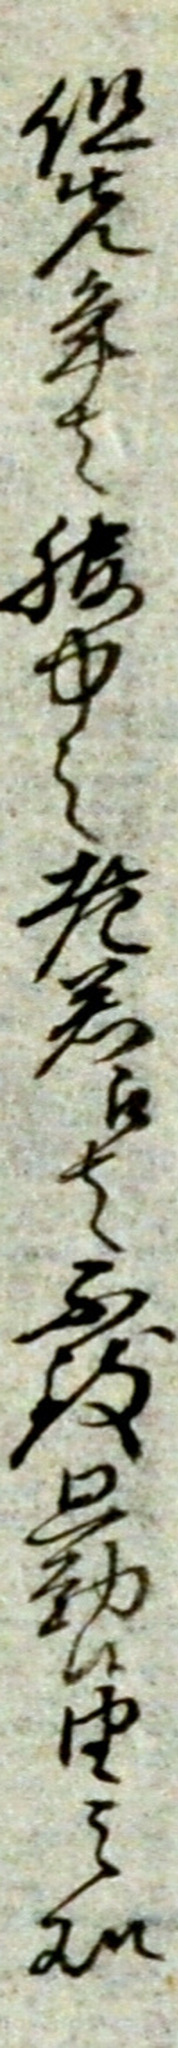但先年者腹中之老若江者不致廻勤候由之処
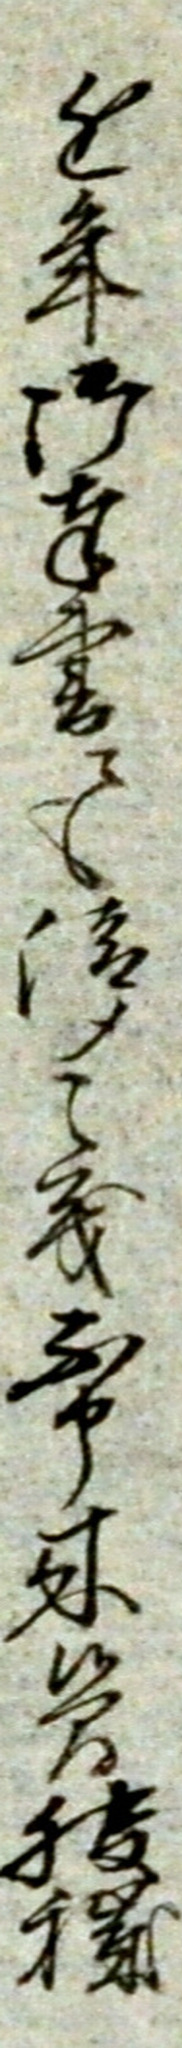近年御奉書ニて清メ之義不申来候間腹穢
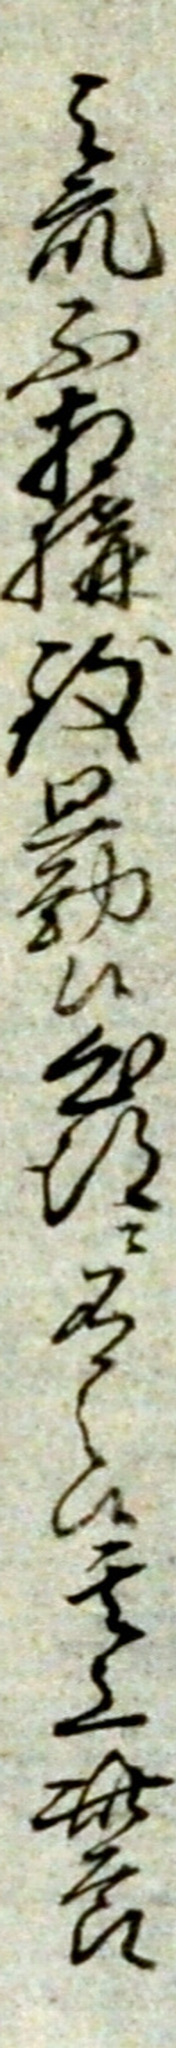之衆不相済致廻勤候心得ニ有之候其上此節
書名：日光御名代相勤候節ノ留
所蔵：伊那市立高遠町図書館・合同会社AMANE
